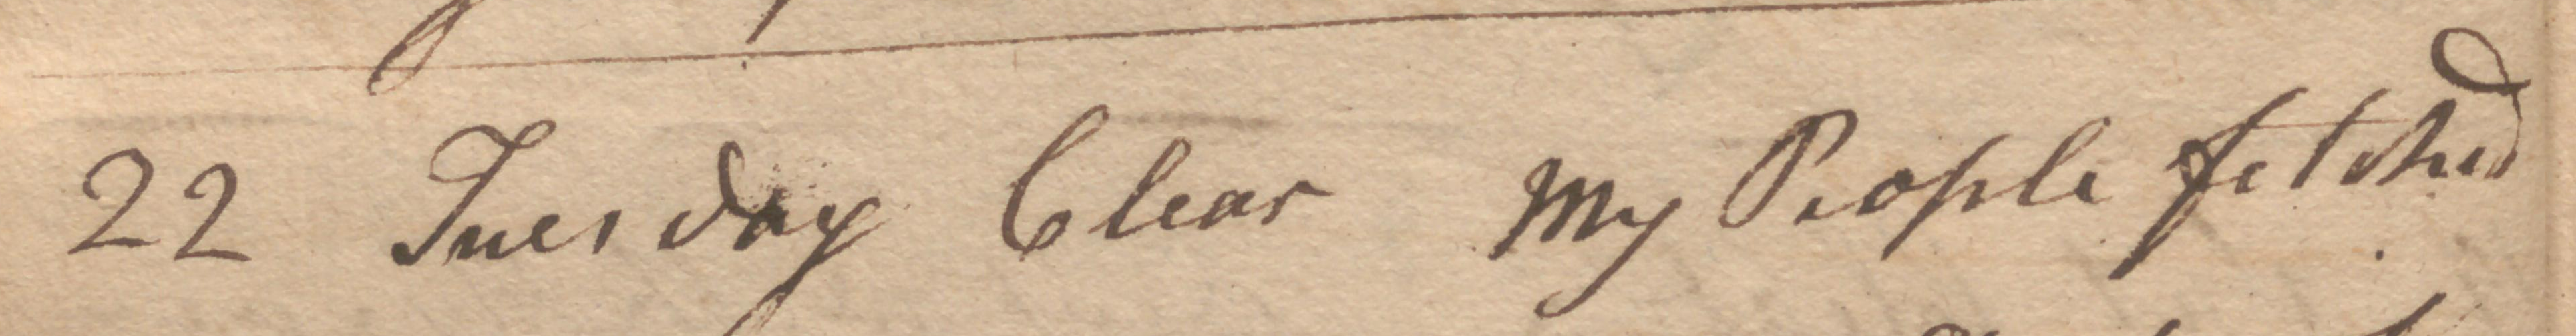22 Tuesday Clear My People fetche
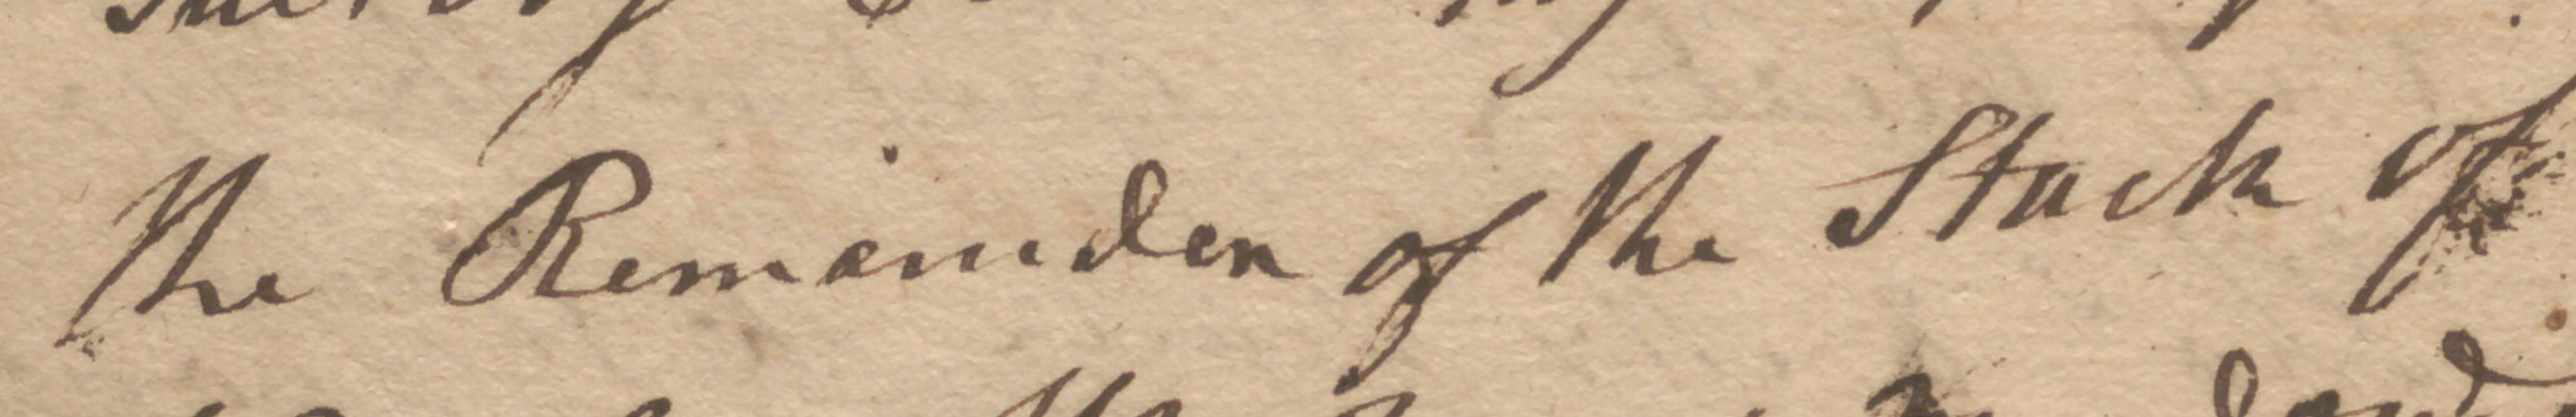the Remainder of the Stack of
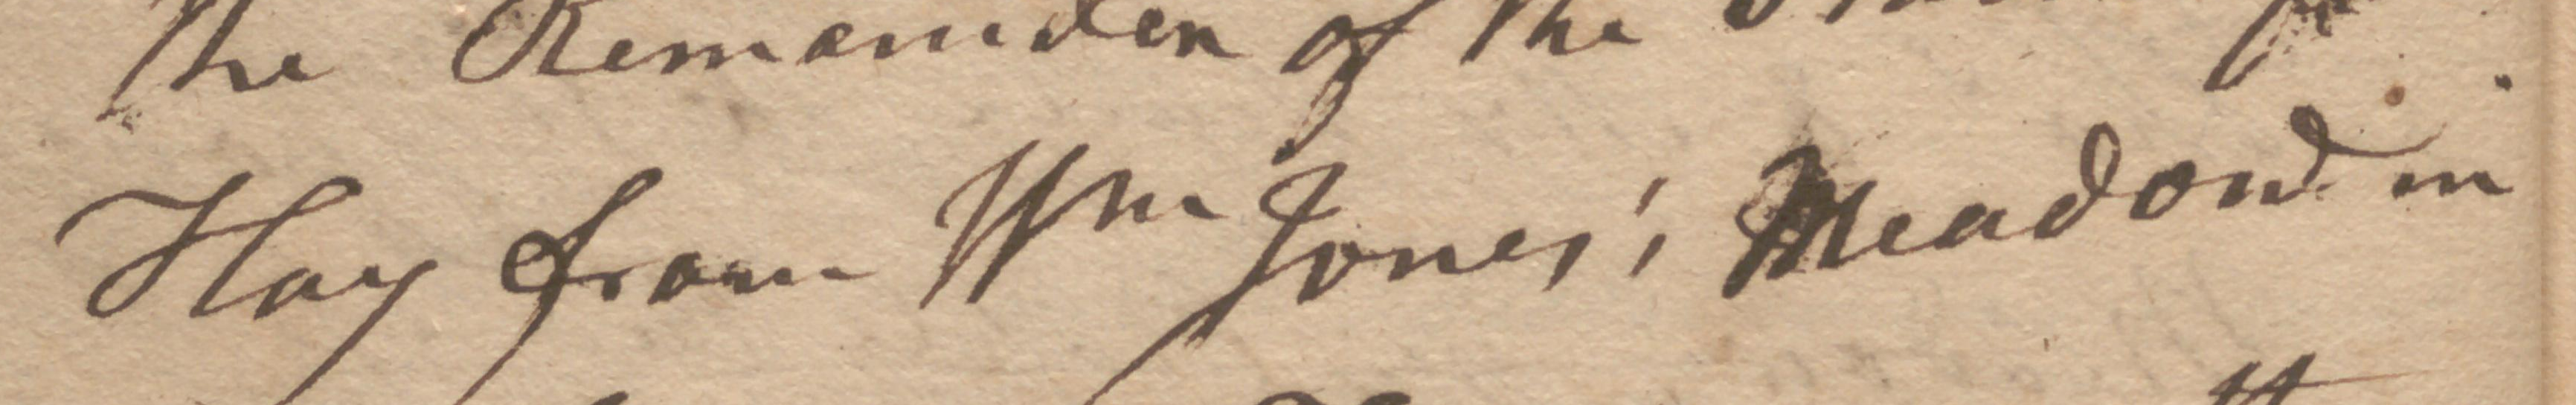Hay from W^m. Jones's Meadow in
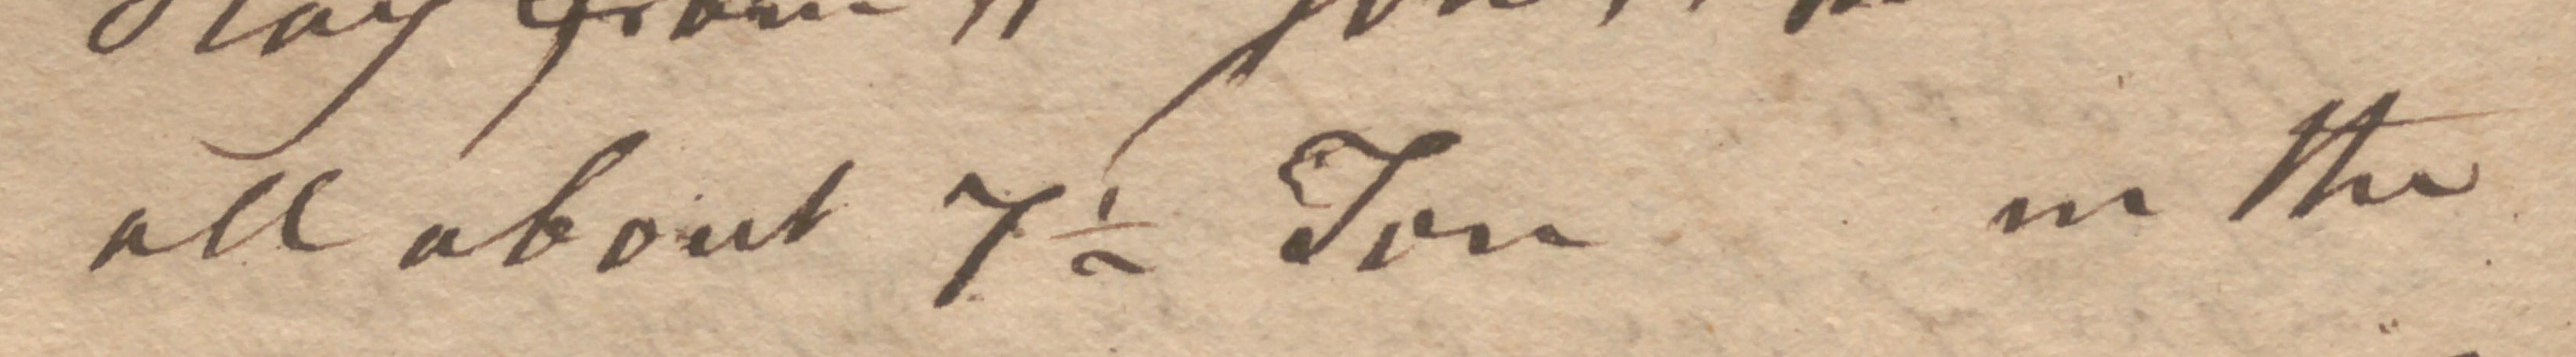all about 7 1/2 Ton in the
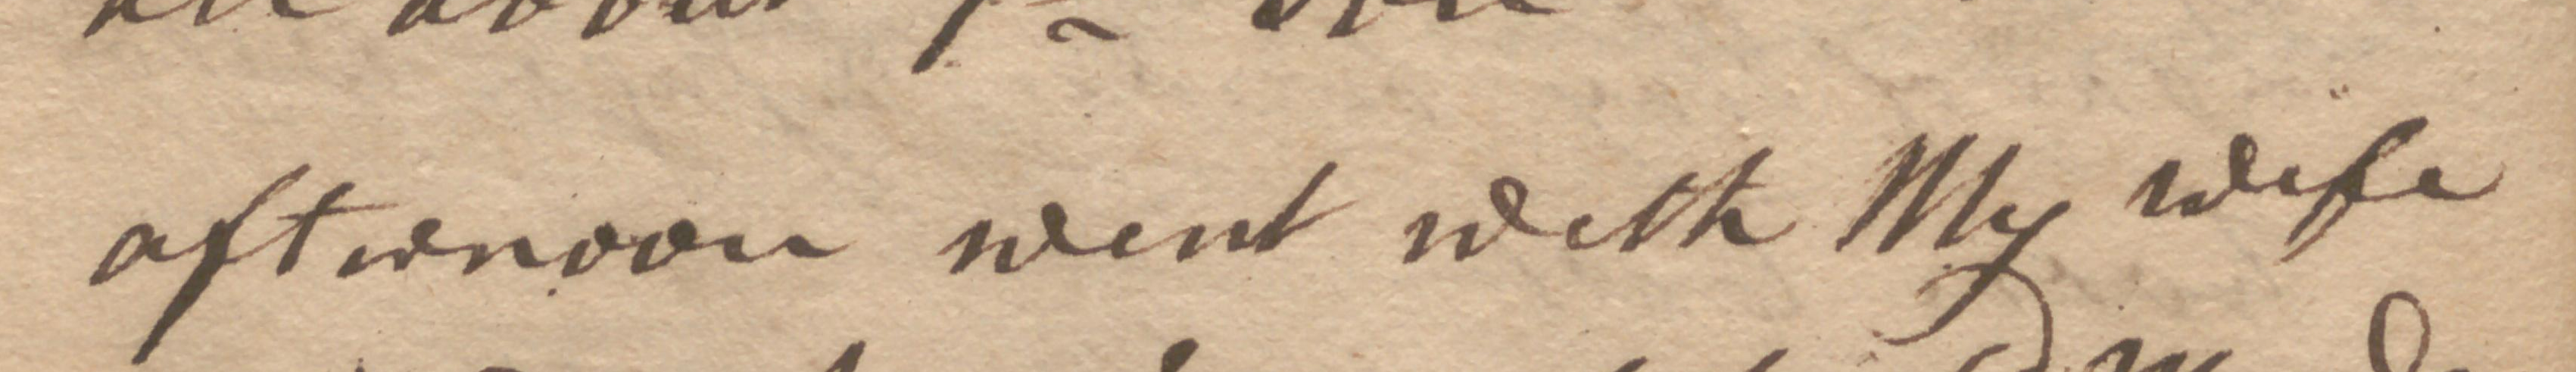afternoon went with My wife
